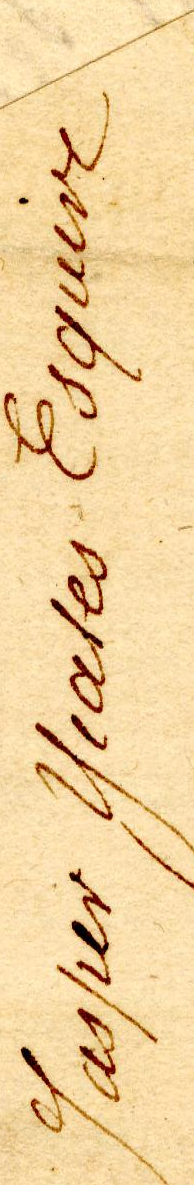Jasper Yeates Esquire
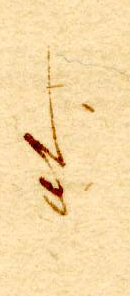at
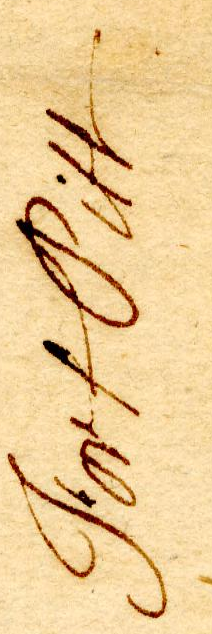Fort Pitt
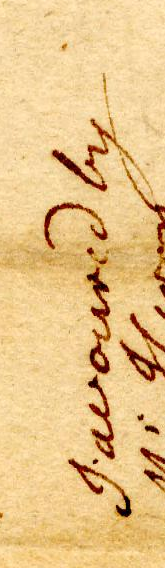Favoured by
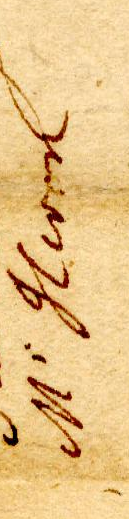M^r Heron
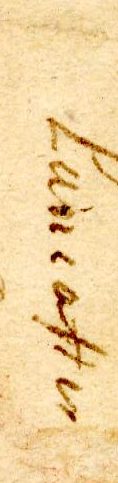Lancaster
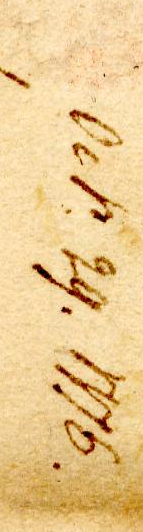Oct. 29. 1776.
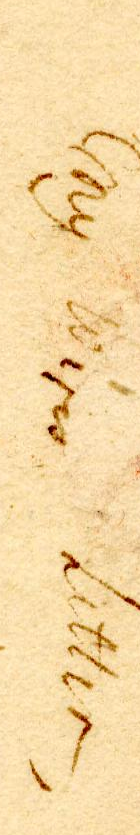My Wifes Letter,
